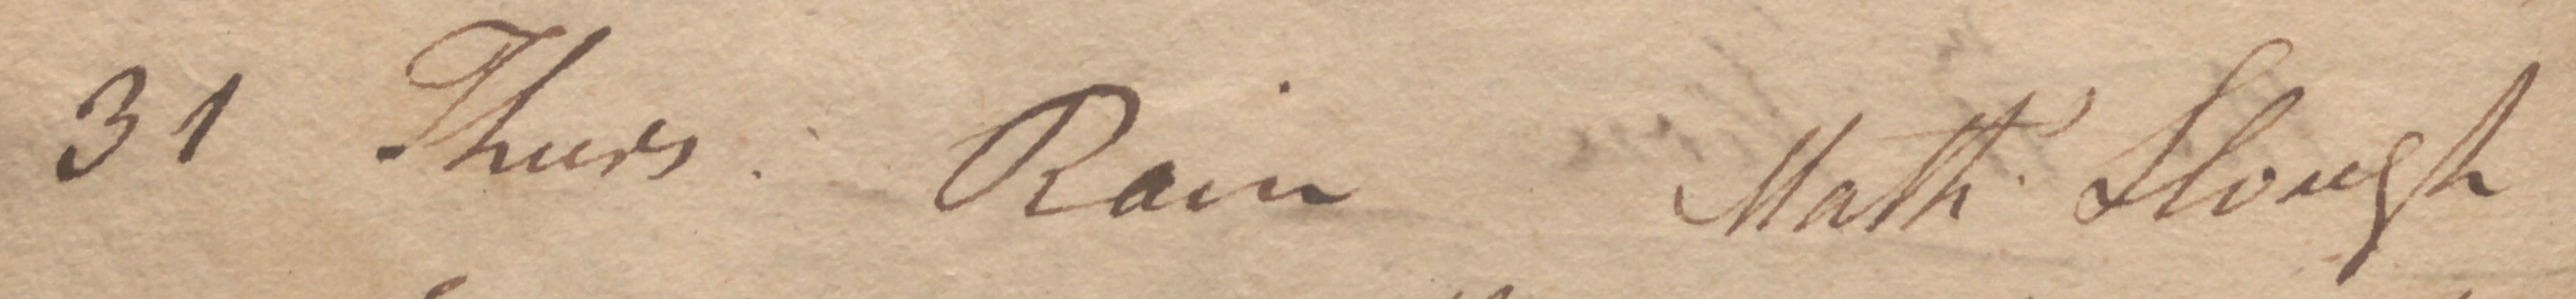31 Thurs. Rain Math^s Slough
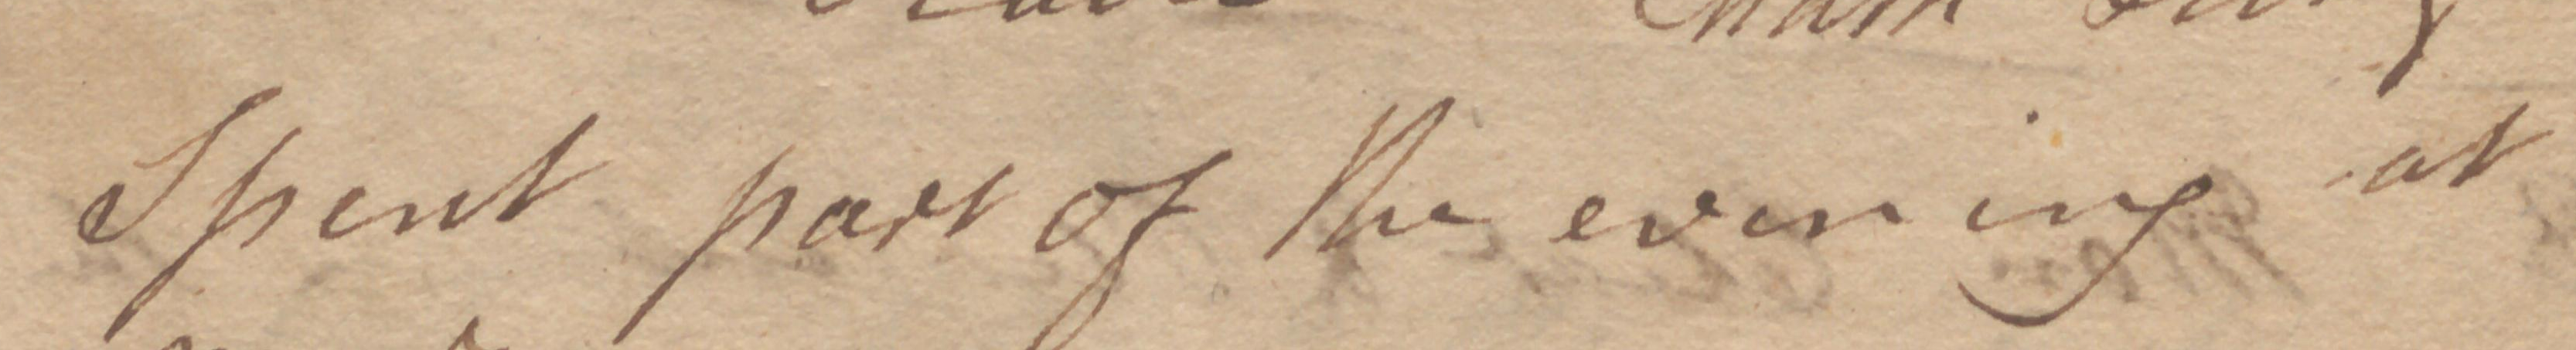spent part of the evening at
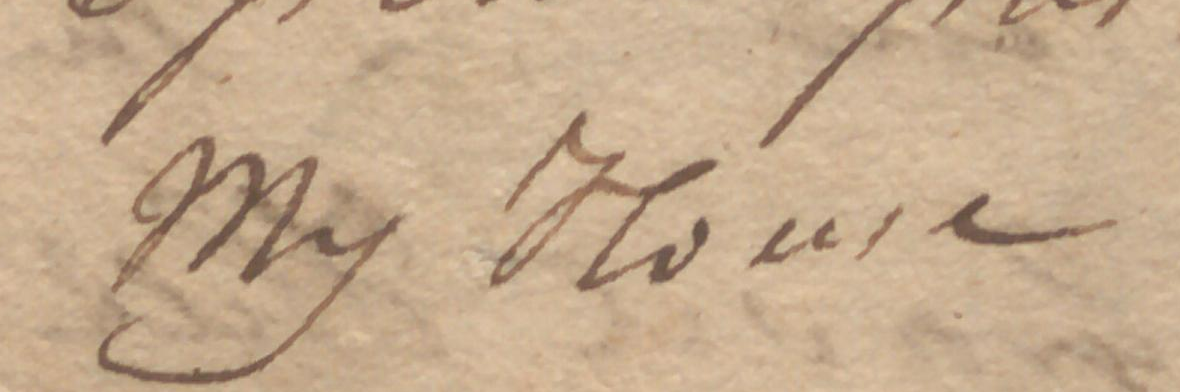My House
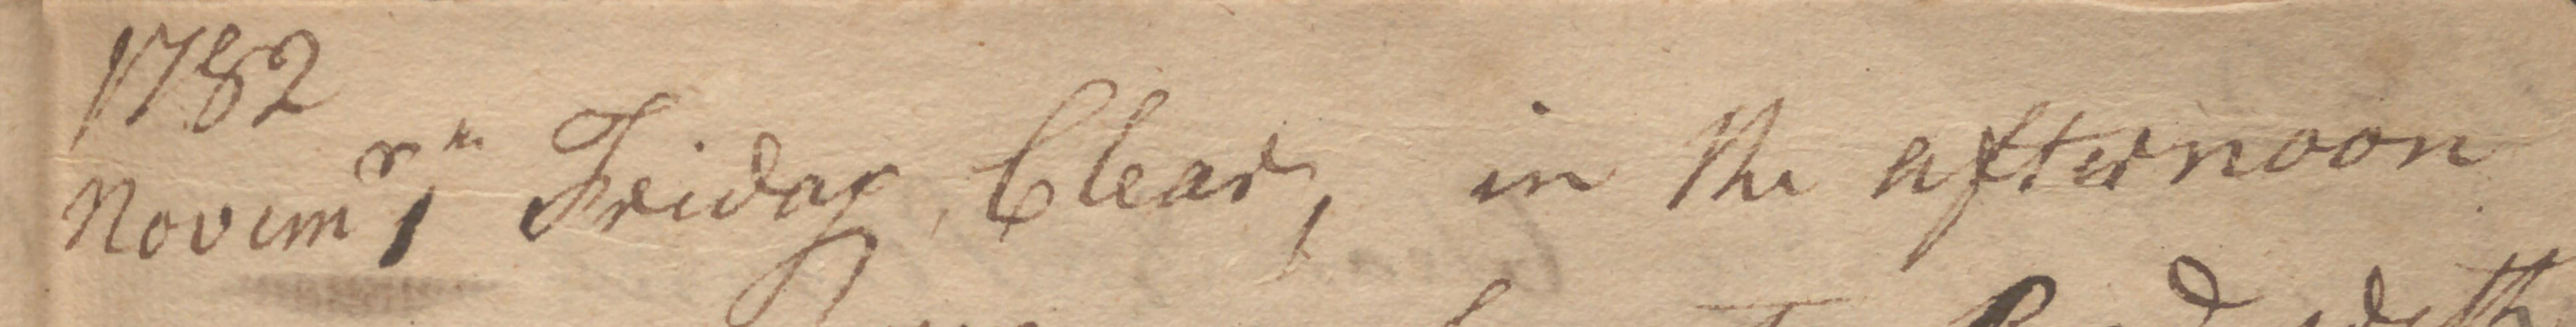Novem^r 1^th Friday Clear, in the afternoon
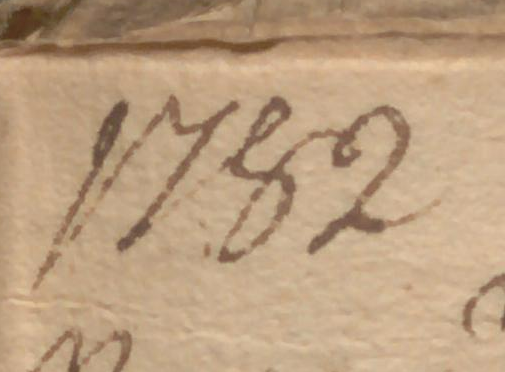1782
